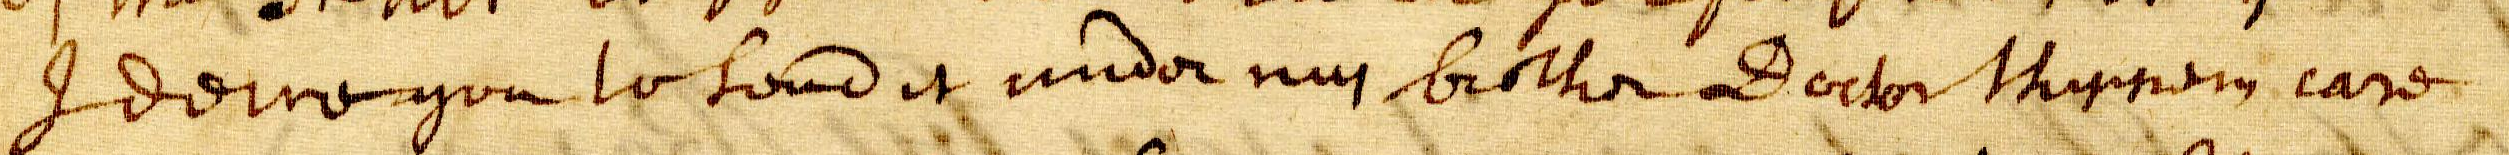I desire you to Send it under my brother Doctor Shippens care
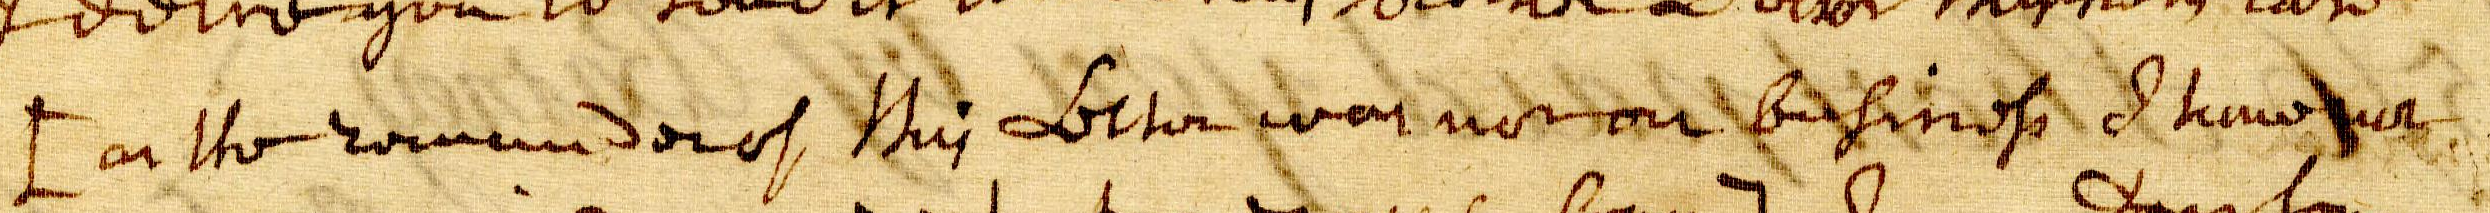(as the remainder of this Letter was not on business I have now
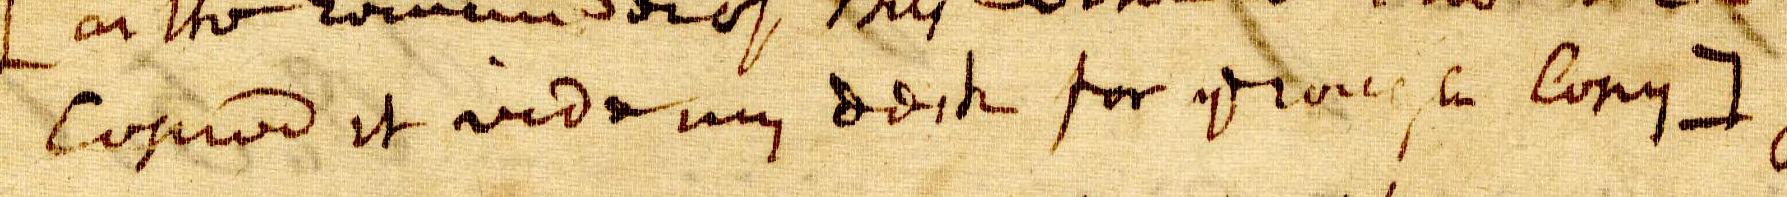Copied it vide my desk for y^r own a Copy)
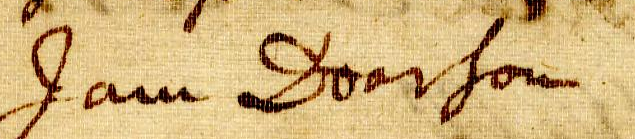I am Dear Son
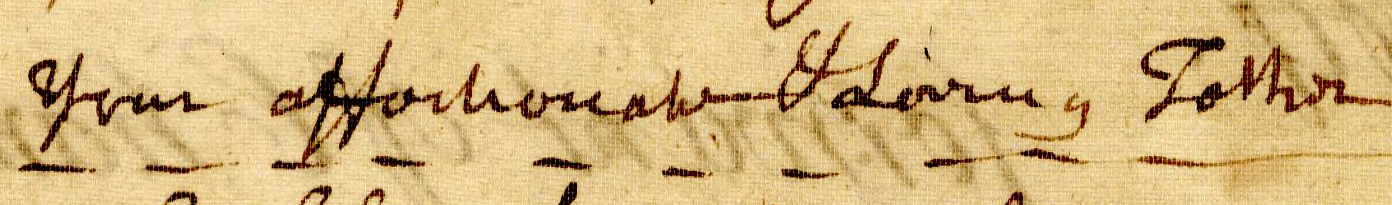Your affectionate & Loving Father
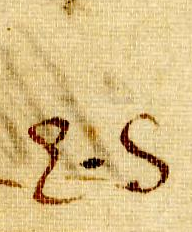E.S
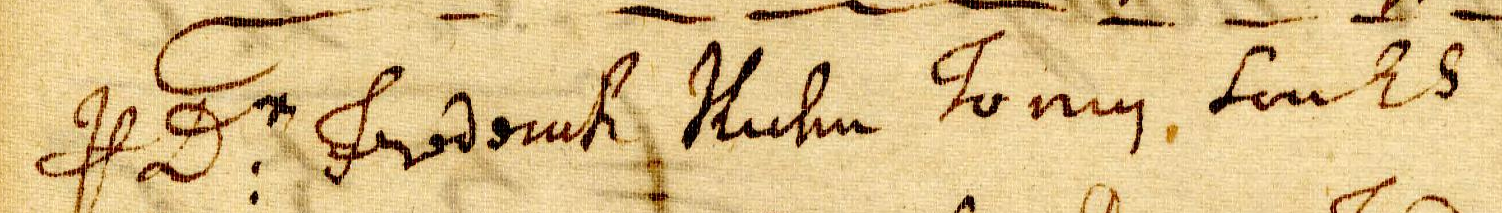per D^r. Frederick Kuhn To my Son ES
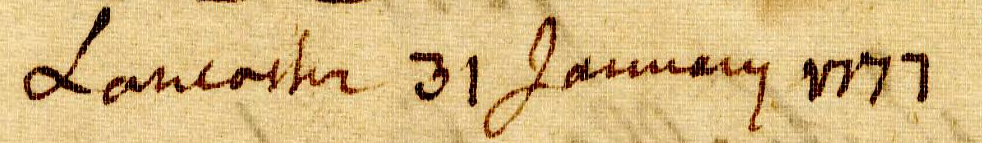Lancaster 31 January 1777
